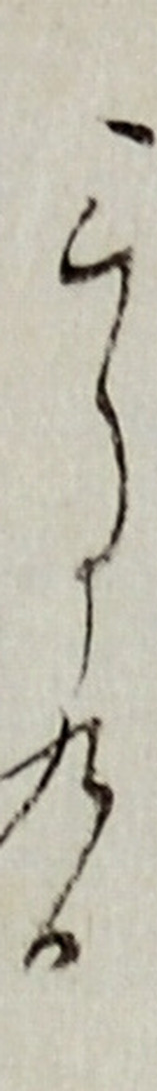三月九日
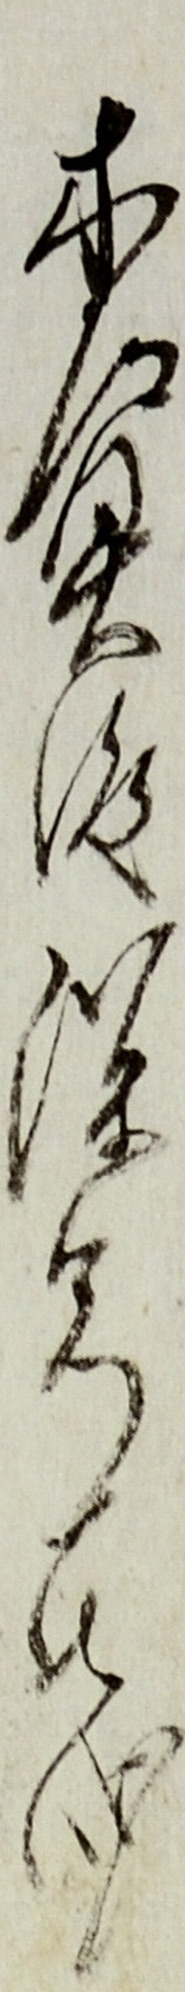木賃渡深右衛門罷越候
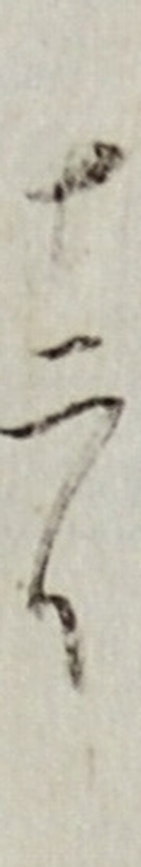十五日
